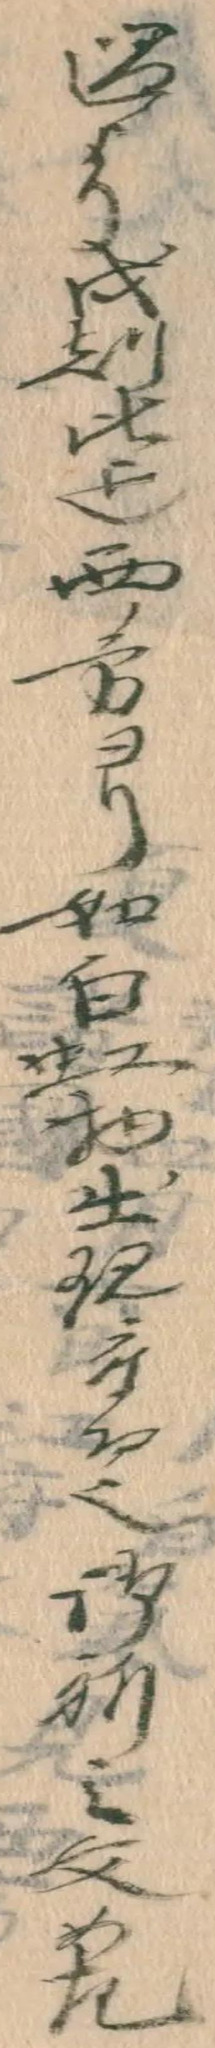過より戌刻比迄西ノ方ヨリ如白虹物出現ニ付而也御祈之文如左
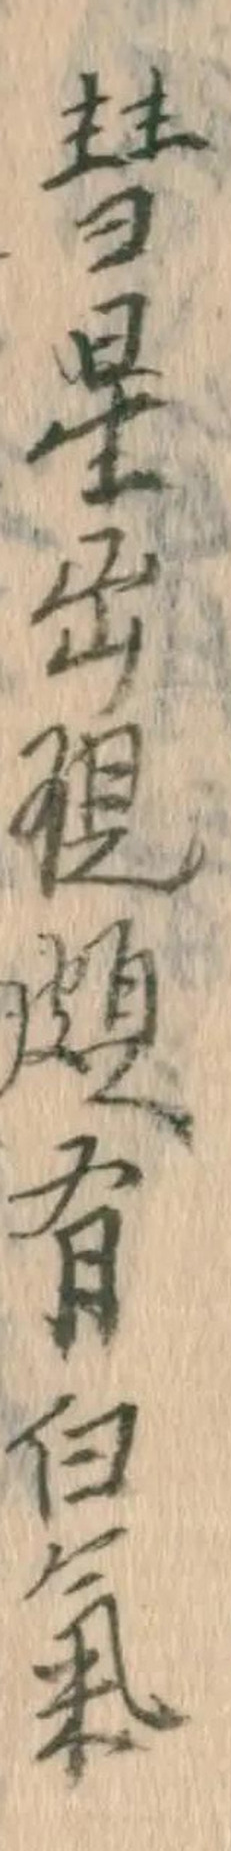彗星出現頗有白氣
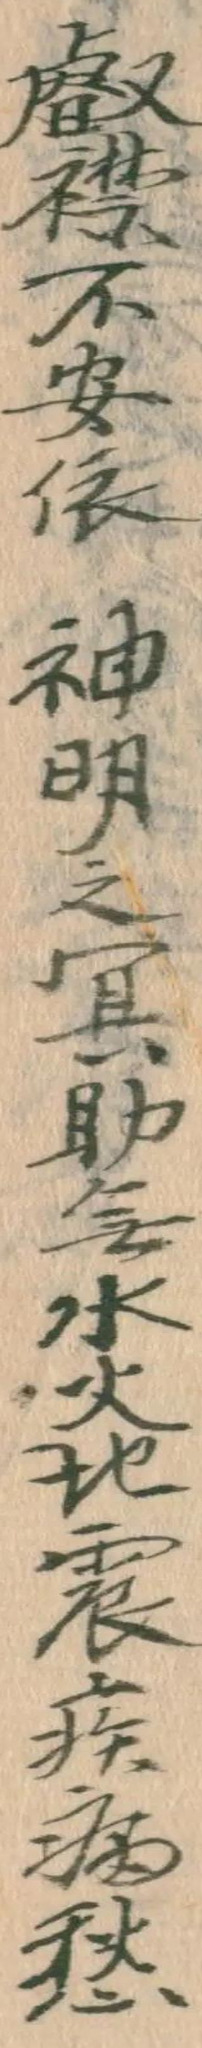叡襟不安依神明之冥助無水火地震疾病愁
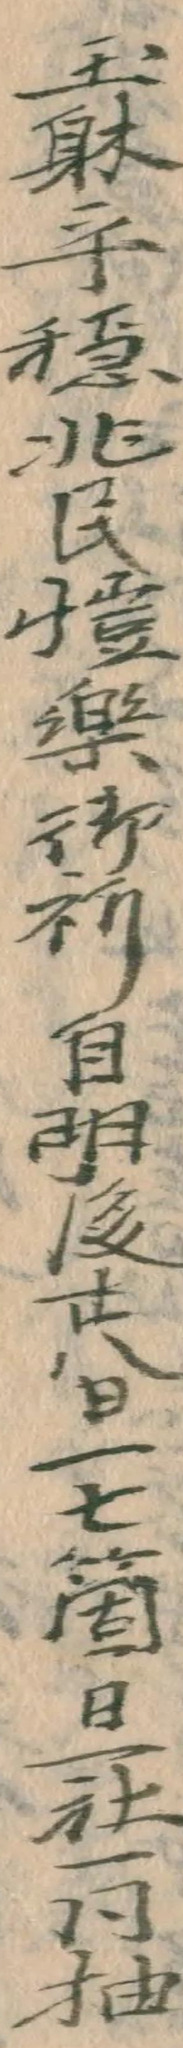玉躰平穏兆民楽御祈自明後廿八日一七箇日一社一同抽
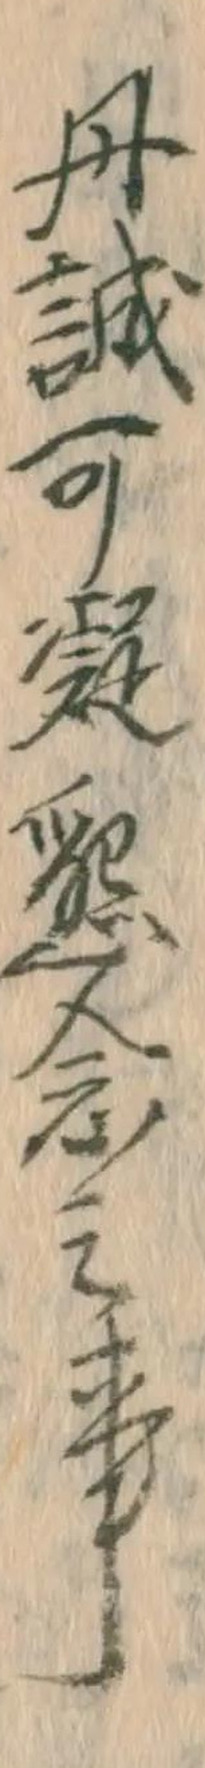丹精可凝懇念之事
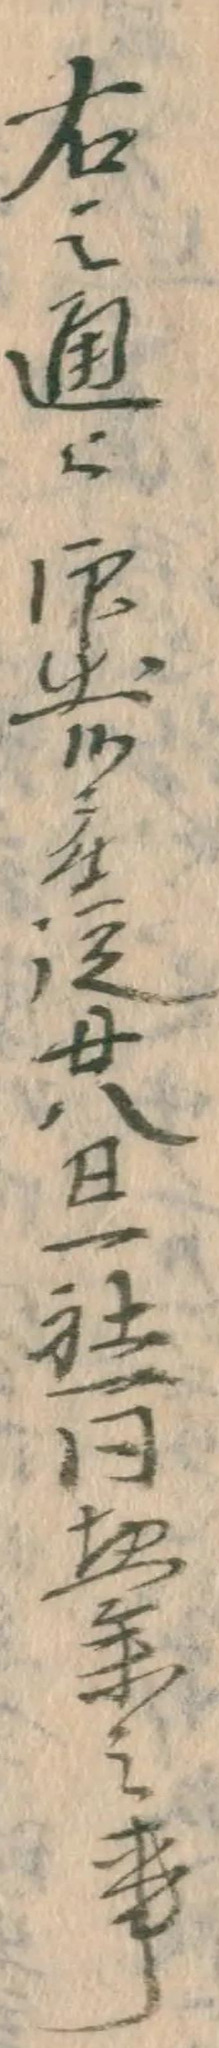右之通被仰出候ニ付従廿八日一社一同惣参之事
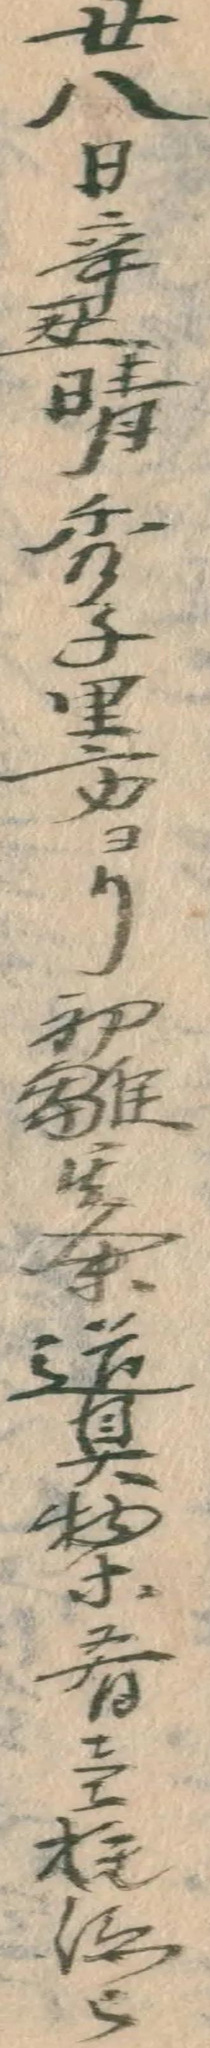廿八日辛丑晴秀子里方より初雛其余道具物等肴壱種添被
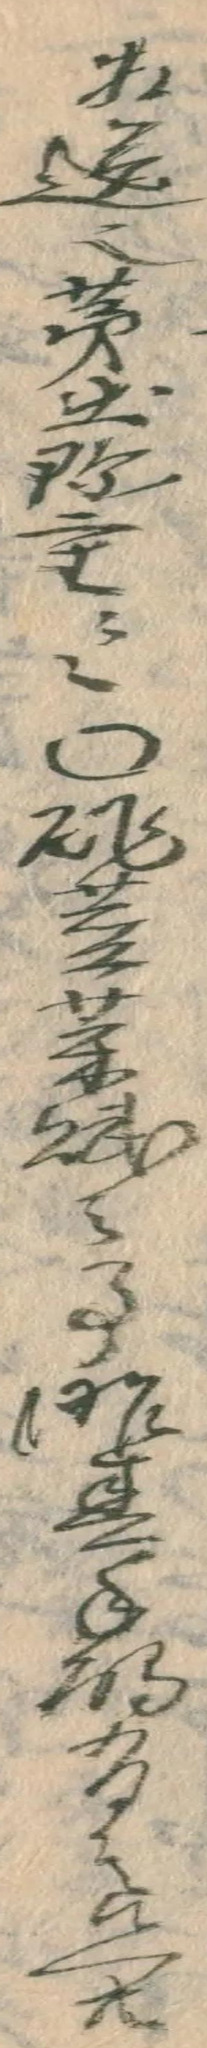相送也茅出珍重々々〇酢茎菜財之事作春手觸有之候得共
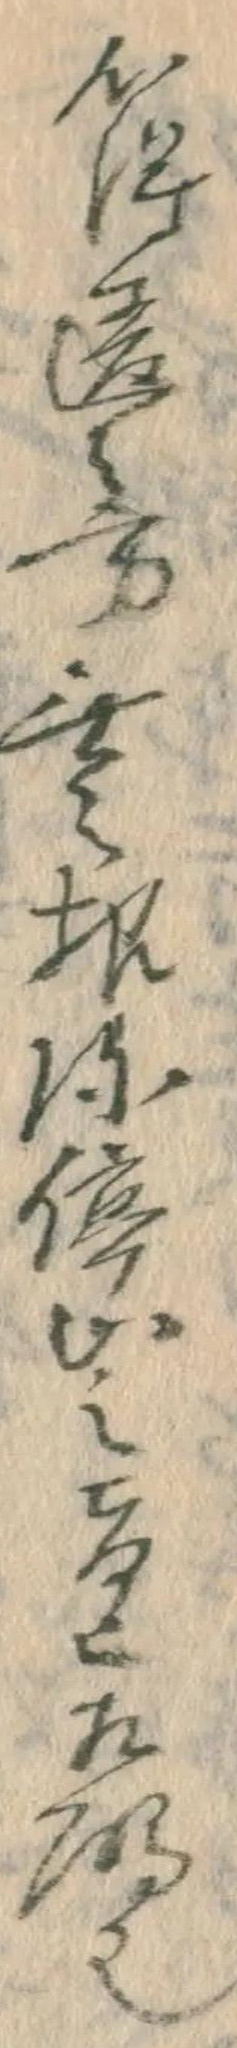心得違之方無之様弥停止之旨被相觸也
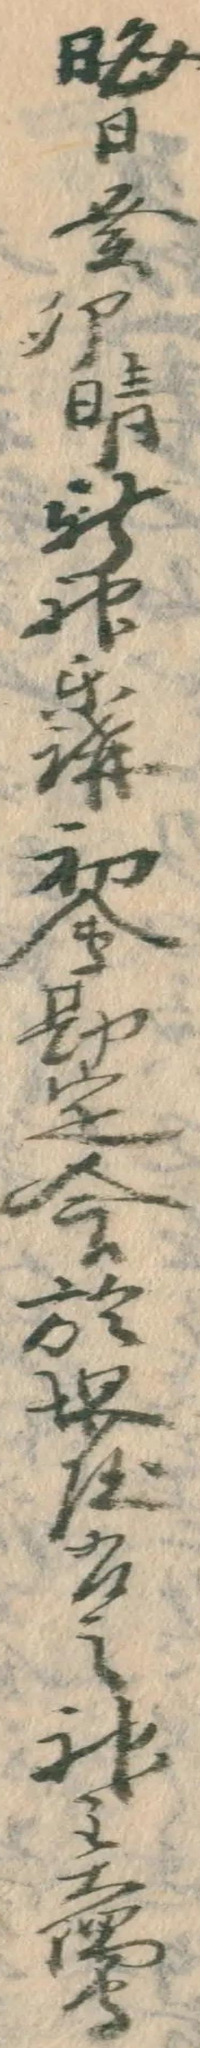晦日癸卯晴新神楽講初會勘定今日於堺屋有之神主大隅守
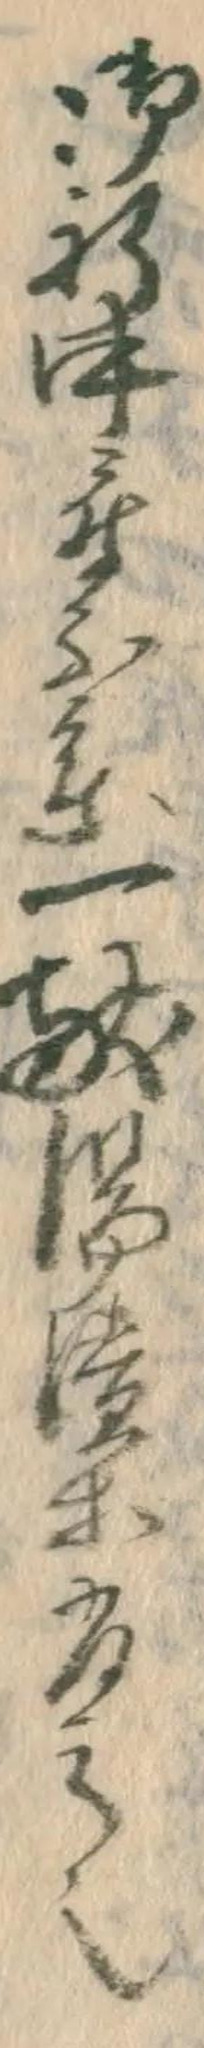御祈中ニ付不参一献湯漬等有之也
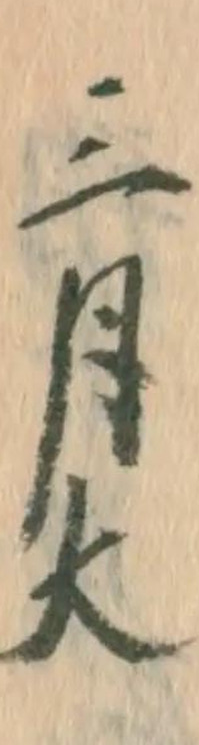三月大

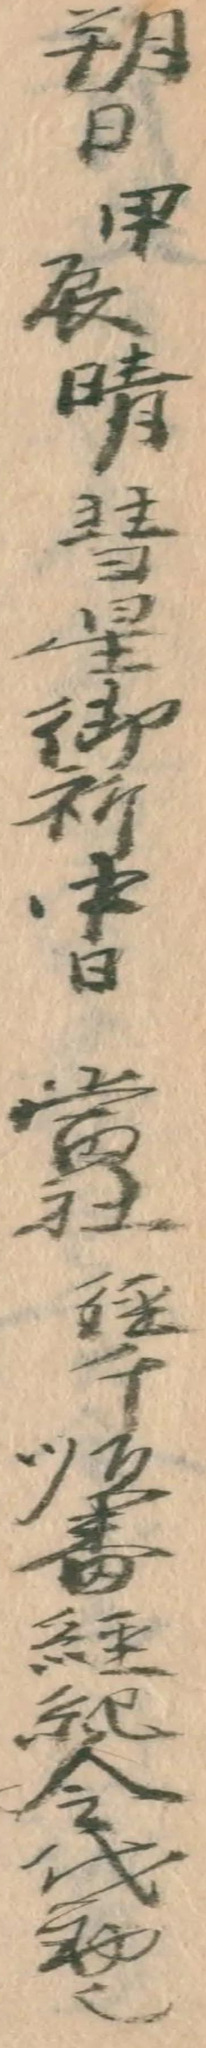朔日甲辰晴彗星御祈中日當社経千順番経紀令代勤也
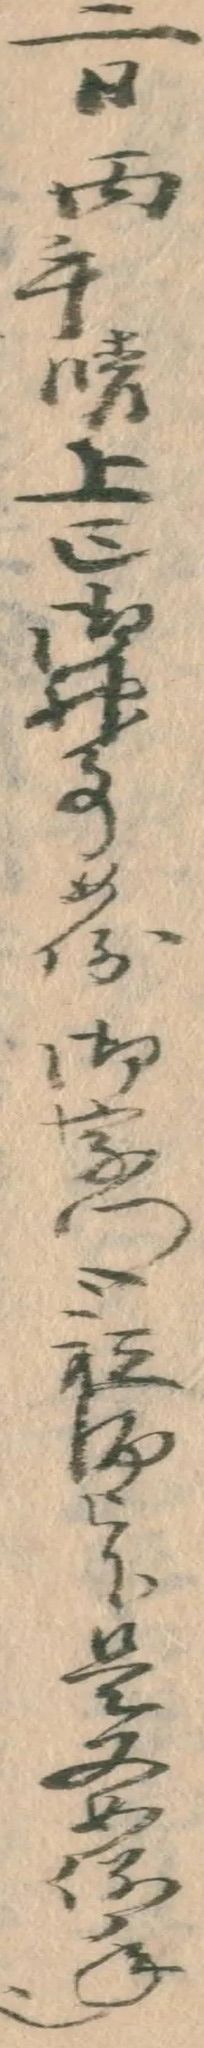三日丙午晴上巳御神事如例御家門御祝酒被下是又如例年也
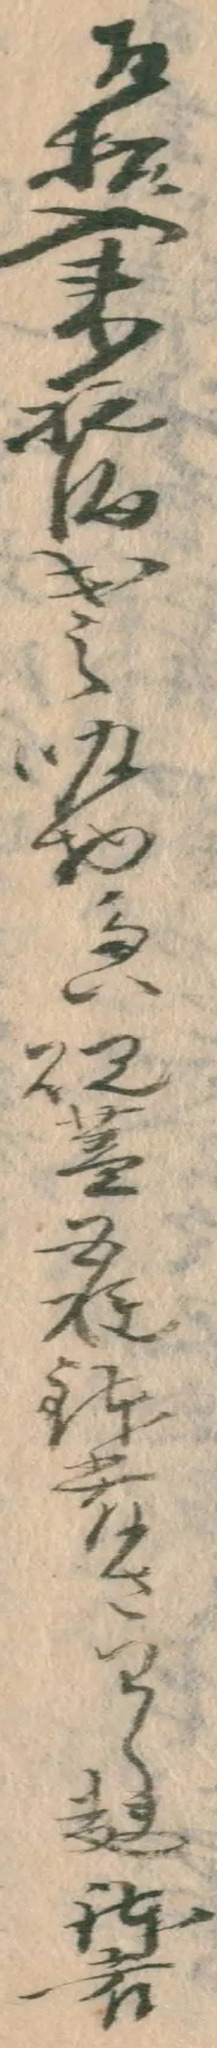相招入来祝酒出之吸物たい硯蓋五種鉢肴さわし麩鉢肴
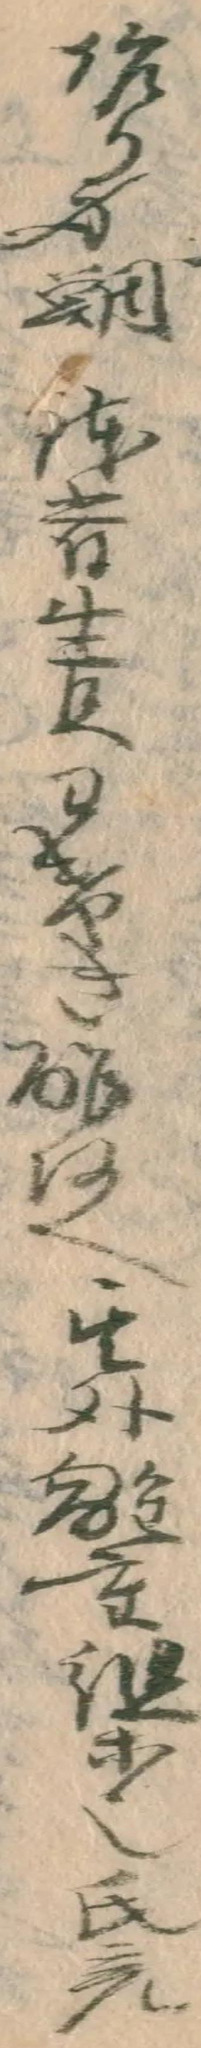作り身鯛鉢肴生貝わけき酢あへ其外雛重組等也氏彦
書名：賀茂社記録. 第69冊
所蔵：国立国会図書館 National Diet Library, JAPAN
